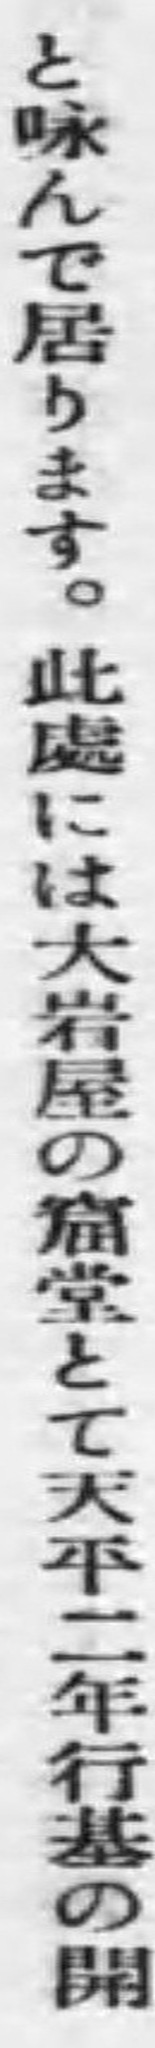と咏んで居ります。此処には大岩屋の窟堂とて天平二年行基の開
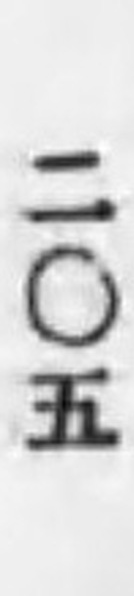二〇五

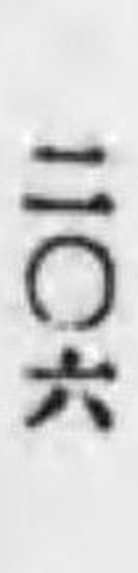二〇六
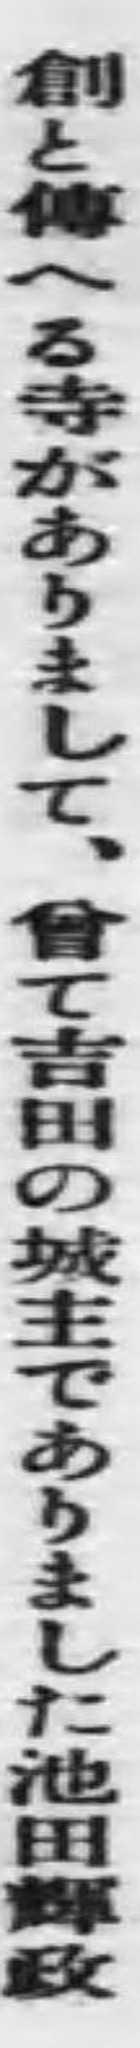創と伝へる寺がありまして、曽て吉田の城主でありました池田輝政
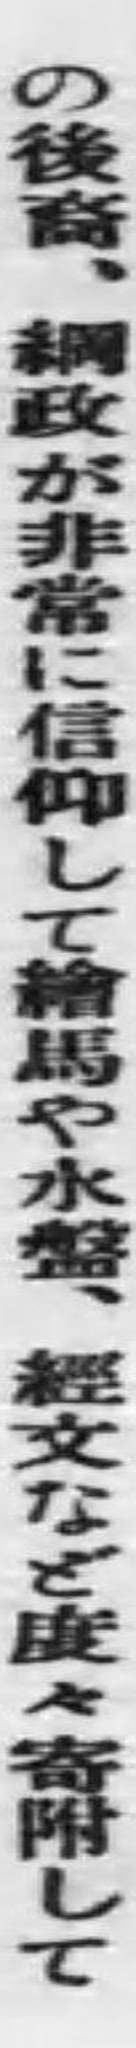の後裔、綱政が非常に信仰して絵馬や水盤、経文など度々寄附して
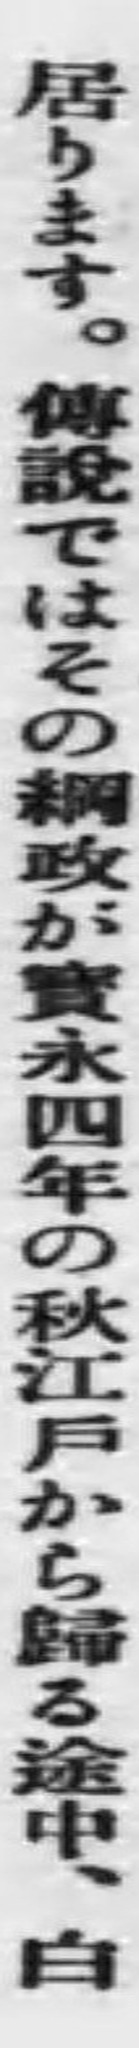居ります。伝説ではその綱政が宝永四年の秋江戸から帰る途中、白
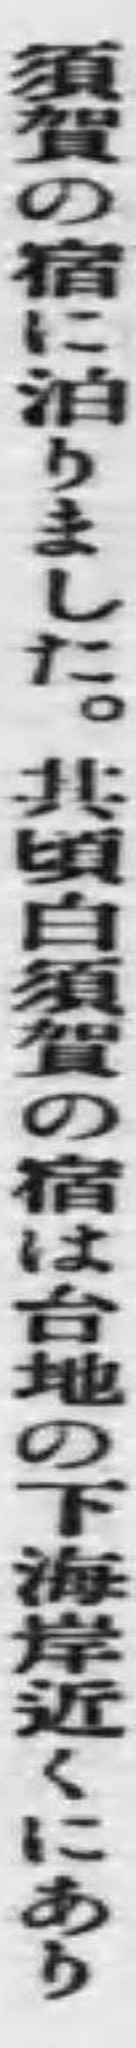須賀の宿に泊りました。其頃白須賀の宿は台地の下海岸近くにあり
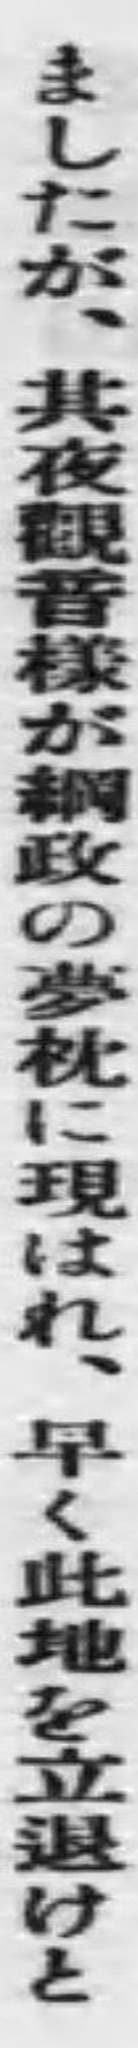ましたが、其夜観音様が網政の夢枕に現はれ、早く此地を立退けと
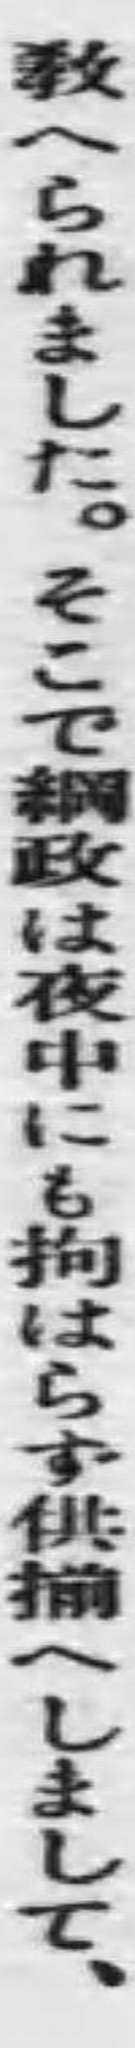教へられました。そこで綱政は夜中にも拘はらず供揃へしまして、
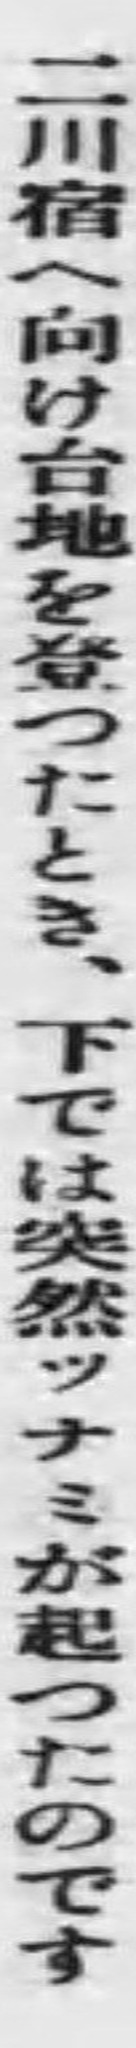二川宿へ向け台地を登つたとき、下では突然ツナミが起つたのです
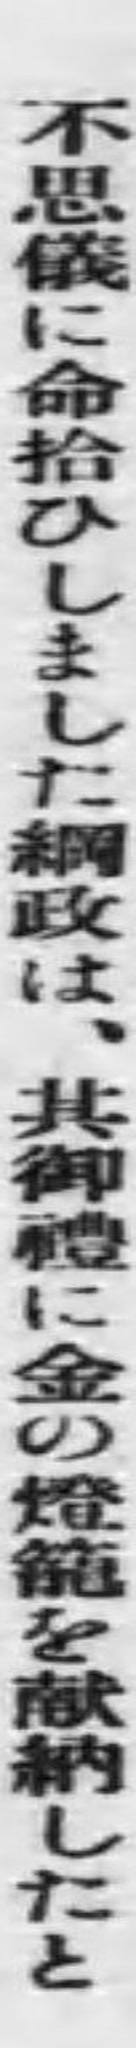不思儀に命拾ひしました綱政は、其御礼に金の灯籠を献納したと
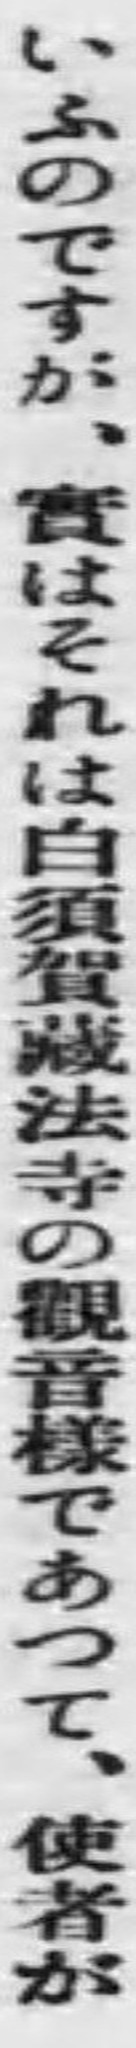いふのですが、実はそれは白須賀蔵法寺の観音様であつて、使者が
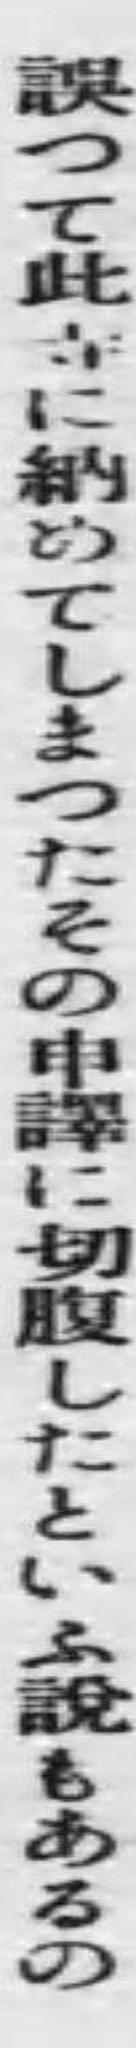誤つて此寺に納めてしまつたその申訳に切腹したといふ説もあるの
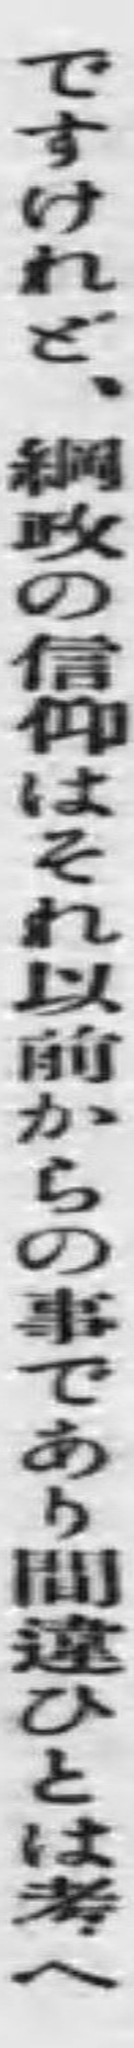ですけれど、綱政の信仰はそれ以前からの事であり間違ひとは考へ
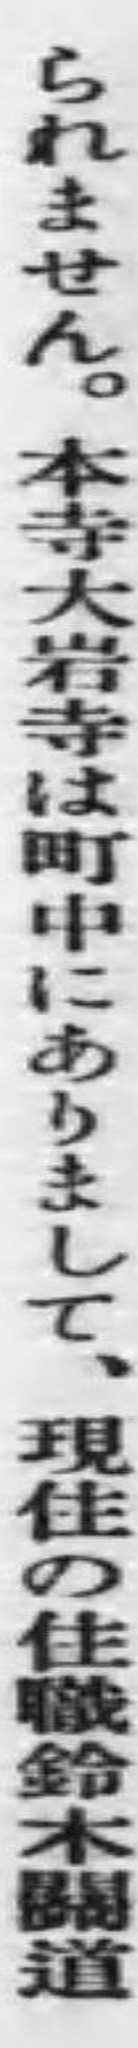られません。本寺大岩寺は町中にありまして、現住の住職鈴木関道
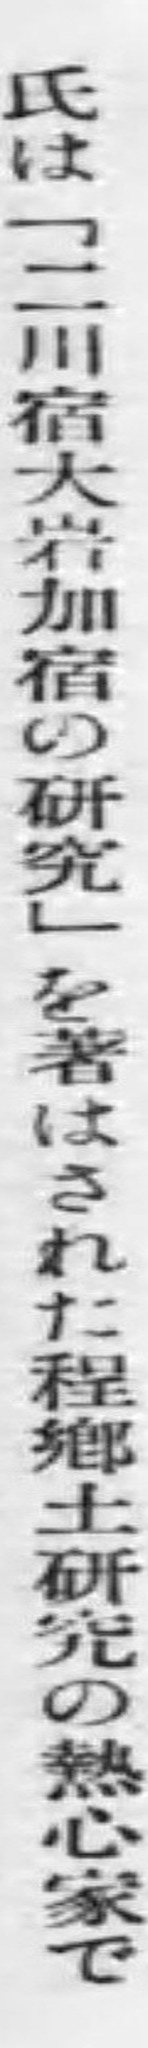氏は「二川宿大岩加宿の研究」を著はされた程郷土研究の熱心家で
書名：東三河道中記 : 豊橋市及其附近案内
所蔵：国立国会図書館 National Diet Library, JAPAN
